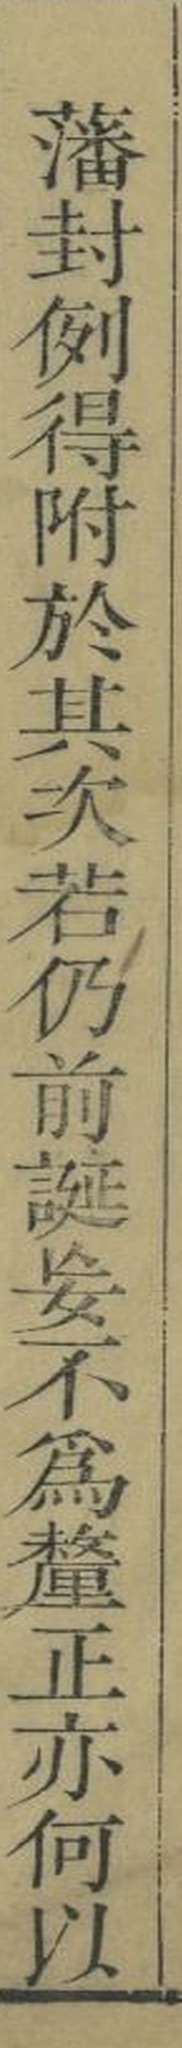藩封例得附於其次若仍前誕妄不爲釐正亦何以
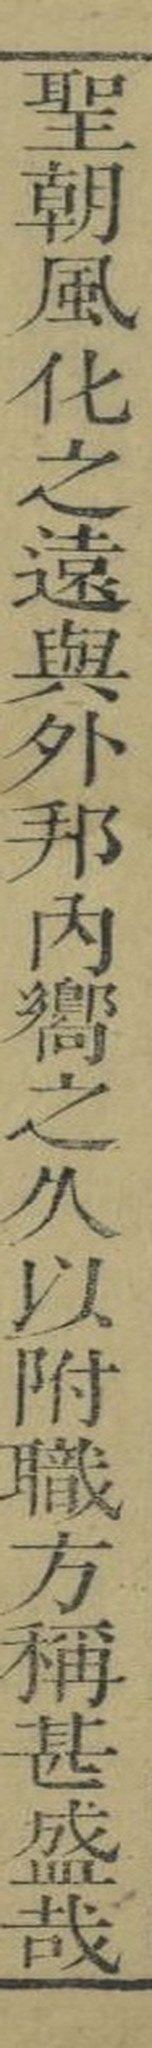聖朝風化之遠與外邦内嚮之久以附職方稱甚盛哉
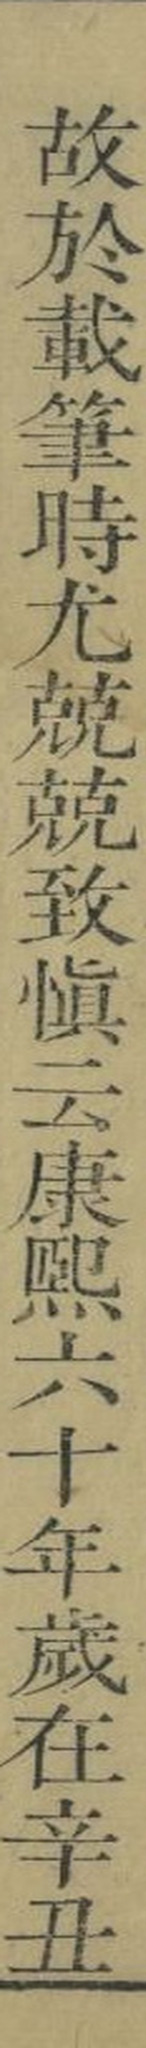故於載筆時尤兢兢致愼云康煕六十年歲在辛丑
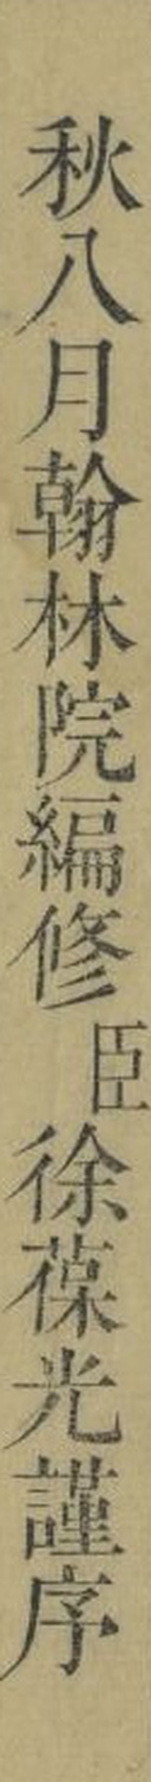秋八月翰林院編修臣徐葆光謹序
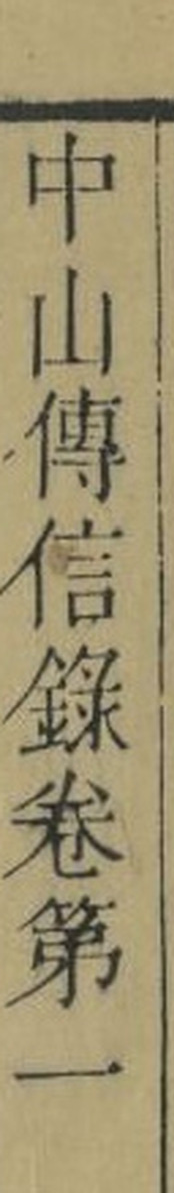中山傳信錄卷第一
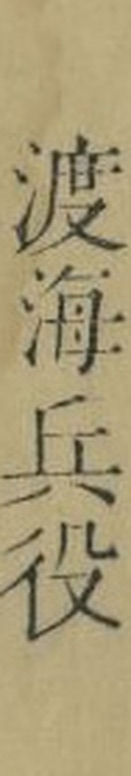渡海兵役
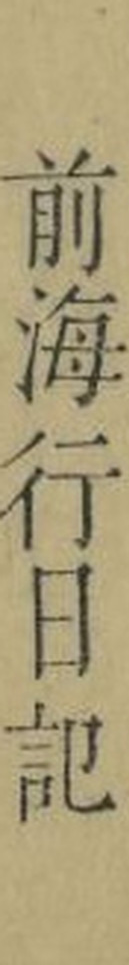前海行日記
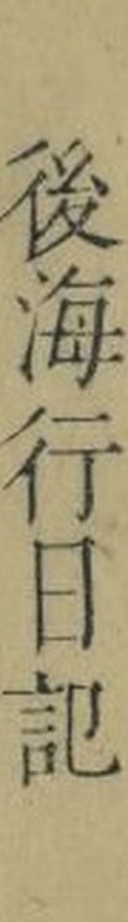後海行日記
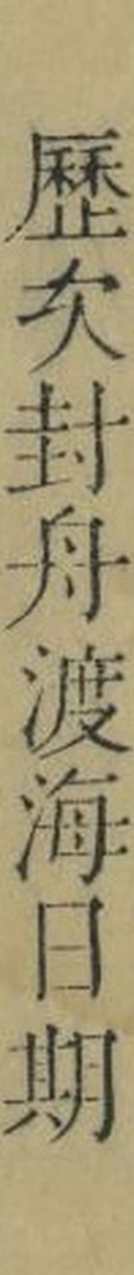歷次封舟渡海日期

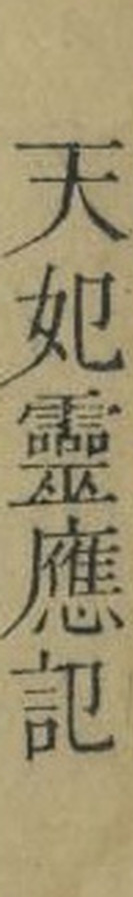天妃靈應記
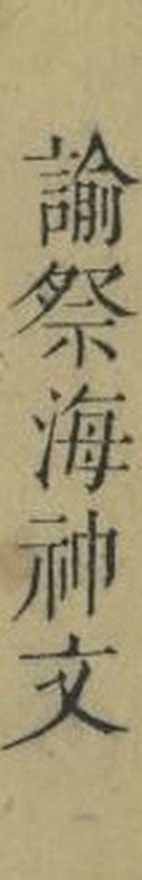諭祭海神文
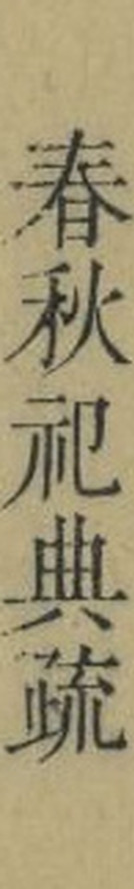春秋祀典疏
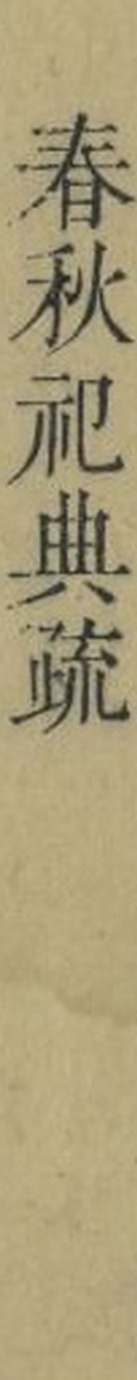春秋祀典疏

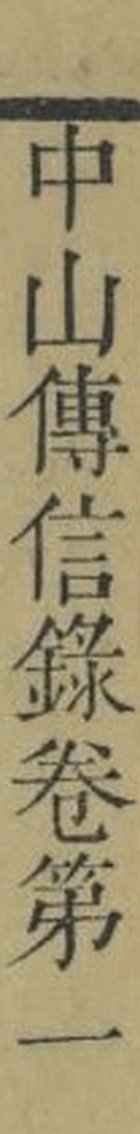中山傳信錄卷第一
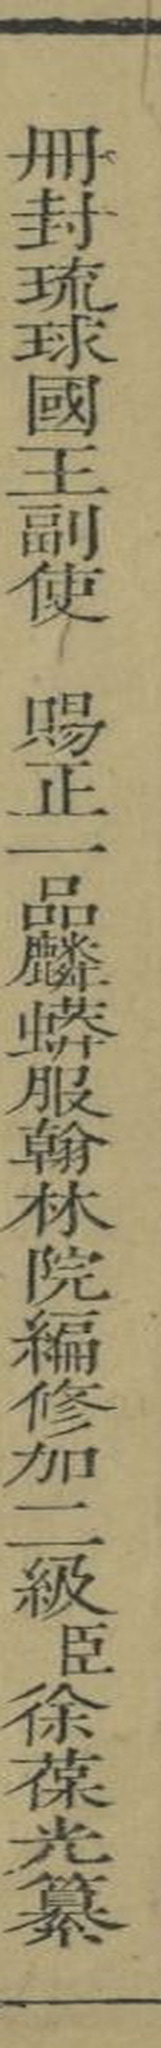冊封琉球國王副使賜正一品麟蟒服翰林院編修加二級臣徐葆光纂
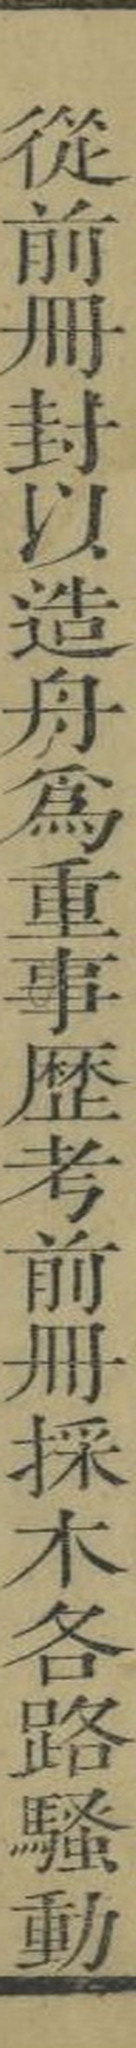從前冊封以造舟爲重事歴考前冊採木各路騷動
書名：中山伝信録 巻一
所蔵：University of the Ryukyus Library
